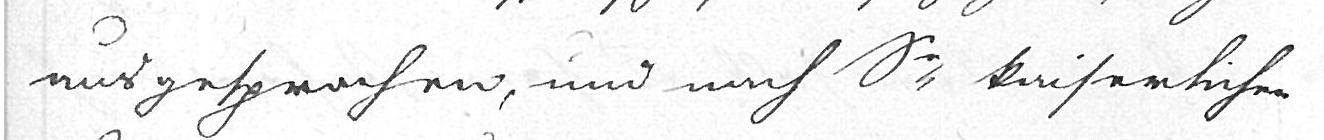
ausgesprochen, und nach Sr. kaiserlichen
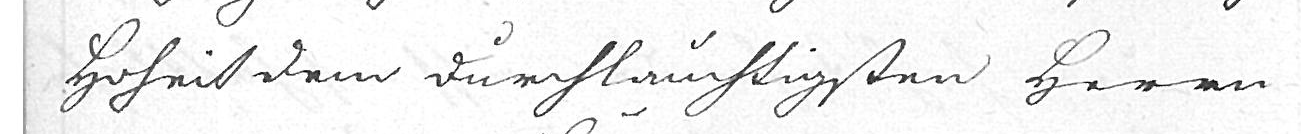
Hoheit dem durchlauchtigsten Herrn
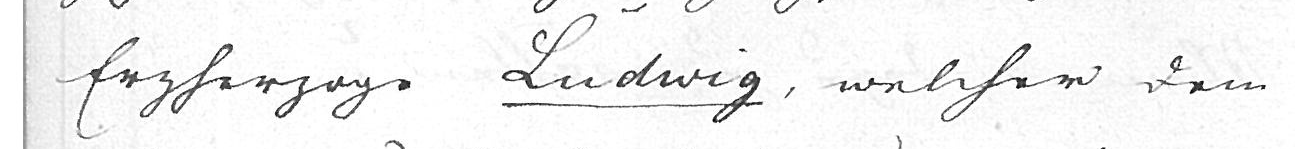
Erzherzog Ludwig, welcher den
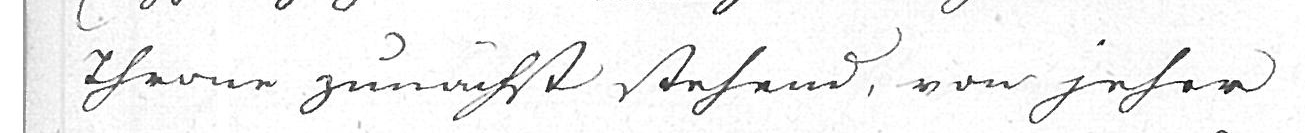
Throne zunächst stehend, von jeher
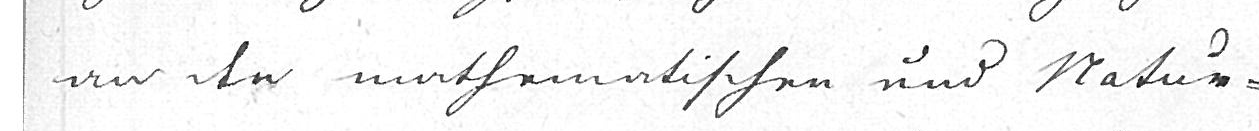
an der mathematischen und Natur-
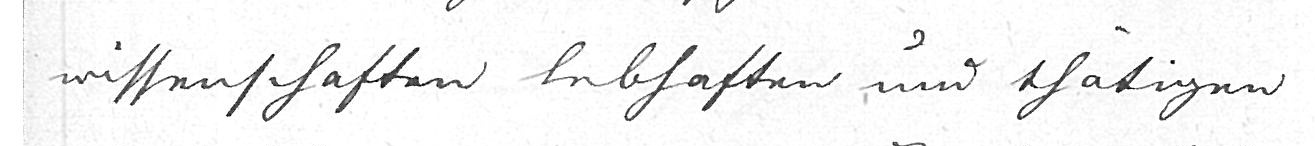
wissenschaften lebhaften und thätigen
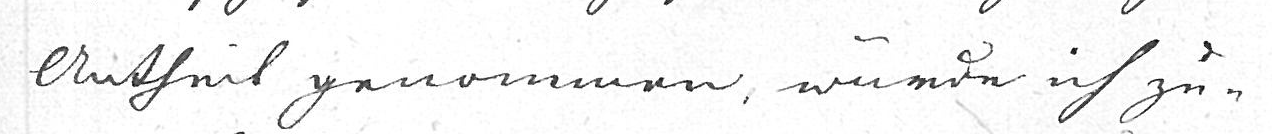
Antheil genommen, würde ich zu-
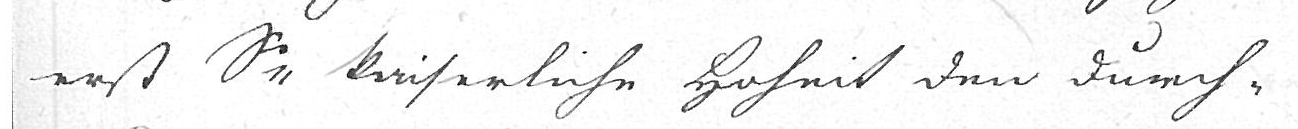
erste Sr. kaiserliche Hoheit den durch-
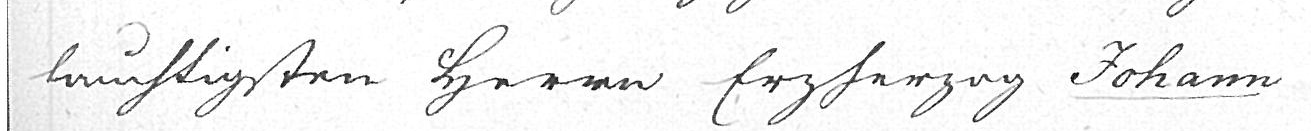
lauchtigsten Herrn Erzherzog Johann
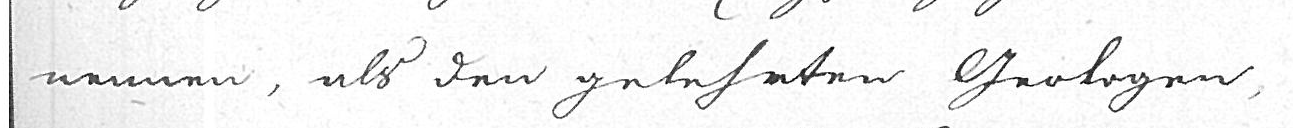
nennen, als den gelehrten Geologen,
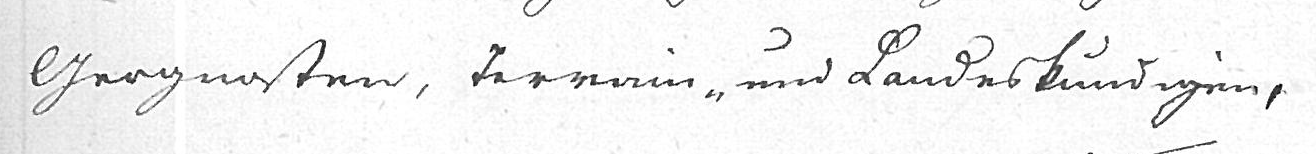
Geognosten, Terrain- und Landeskundigen,
